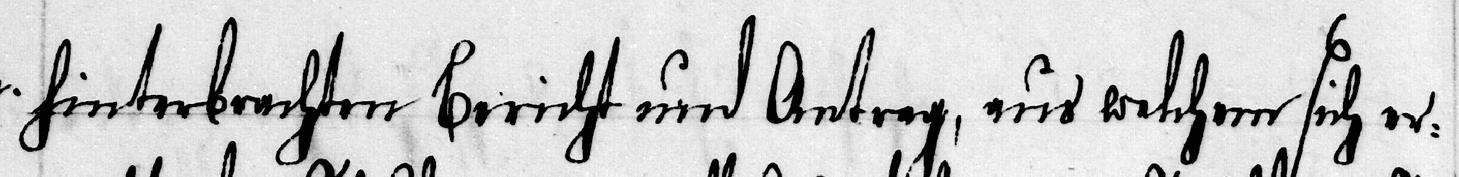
hinterbrachten Bericht und Antrag, aus welchem sich er¬
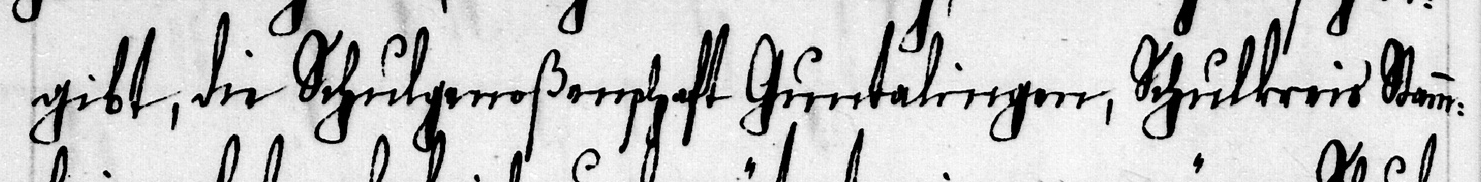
gibt, die Schulgenoßenschaft Guntalingen, Schulkreis Stam¬
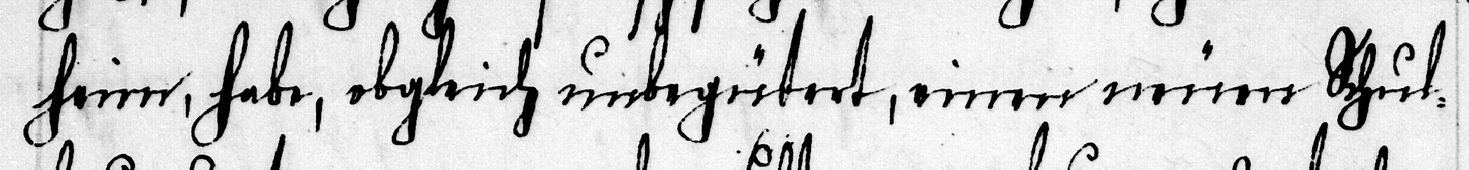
mheim, habe, obgleich unbegütert, einen neuen Schul¬
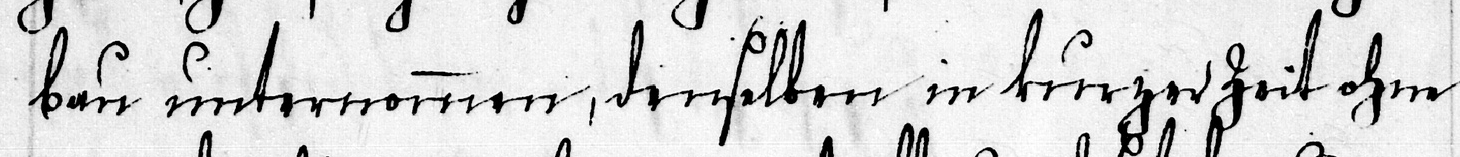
bau unternommen, denselben in kurzer Zeit ohne
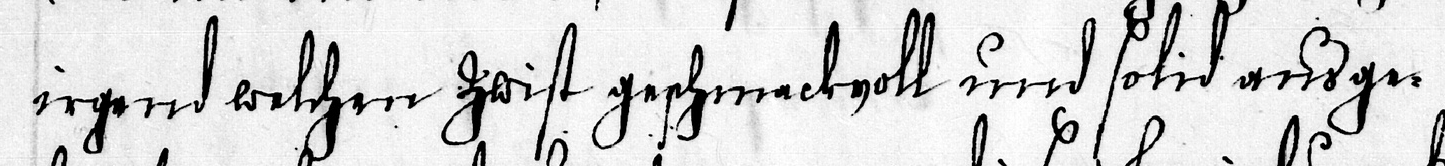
irgend welchen Zwist geschmackvoll und solid ausge¬
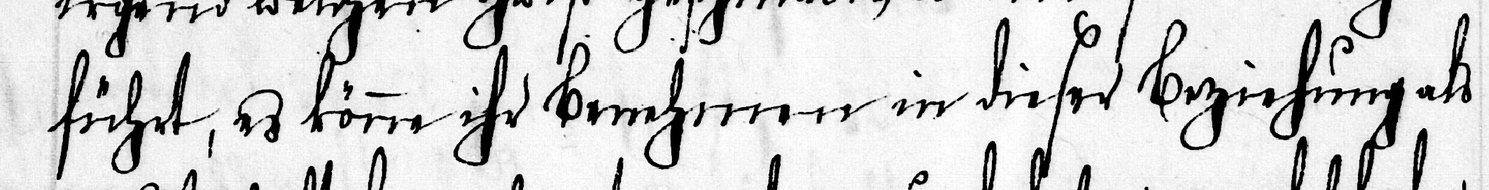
führt, es könne ihr Benehmen in dieser Beziehung als
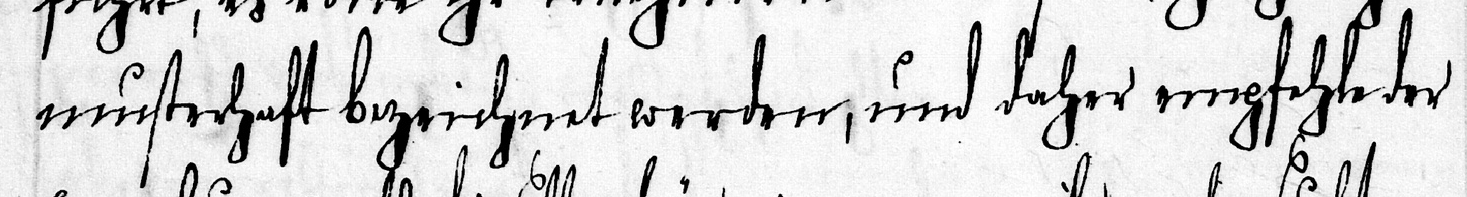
musterhaft bezeichnet werden, und daher empfehle der
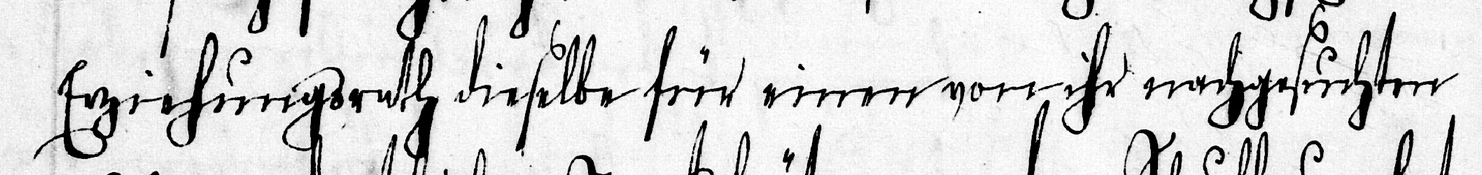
Erziehungsrath dieselbe für einen von ihr nachgesuchten
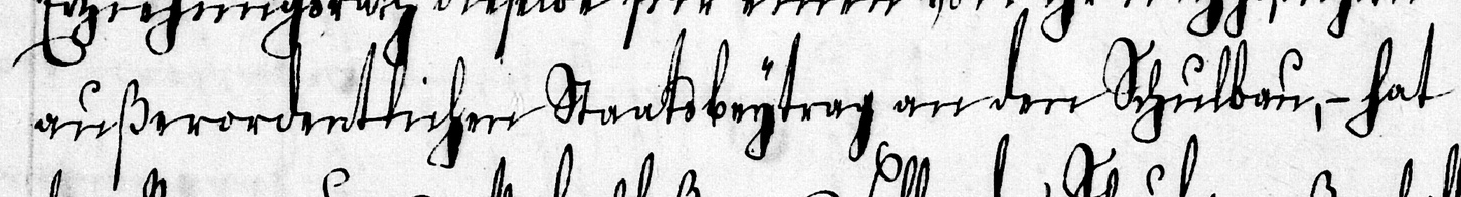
außerordentlichen Staatsbeytrag an den Schulbau, – hat
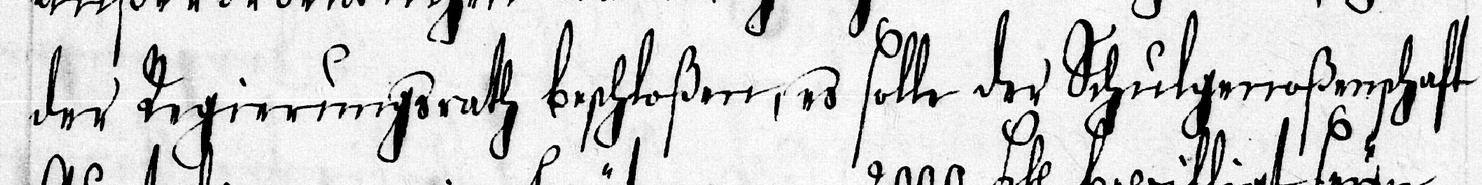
der Regierungsrath beschloßen, es solle der Schulgenoßenschaft
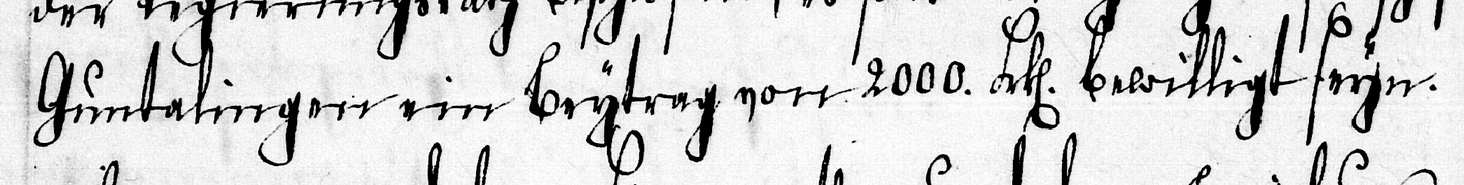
Guntalingen ein Beytrag von 2000. Frk[en]. bewilligt seyn.
